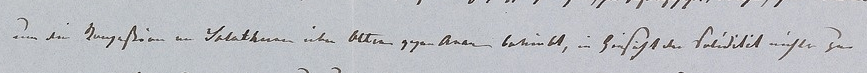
um die Konzeßion von Solothurn über Olten gegen Arau bewirbt, in Hinsicht der Solidität nichts zu
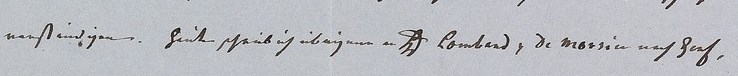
verständigen. Heute schrieb ich übrigens an Herrn Lombard & De Morsier nach Genf.
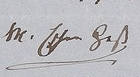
M. Escher Heß
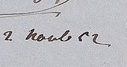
2. Novb 52.
